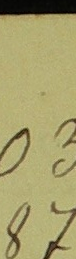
--
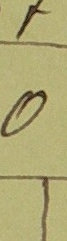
22
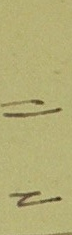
--
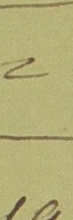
87
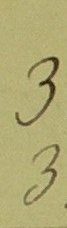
--
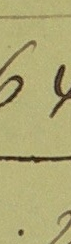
--
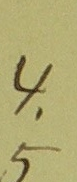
--
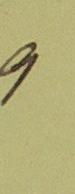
--
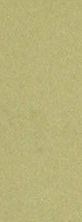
--
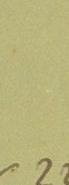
50
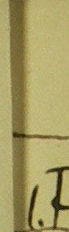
--
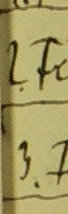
30
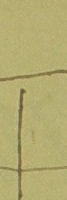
--
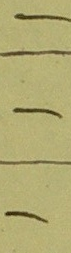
--
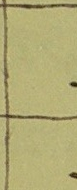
--
